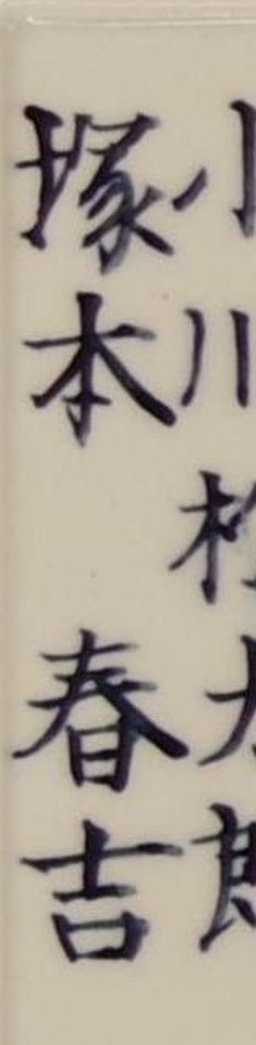塚本春吉

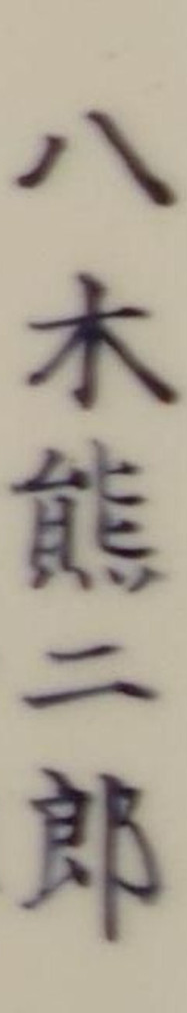八木熊二郎
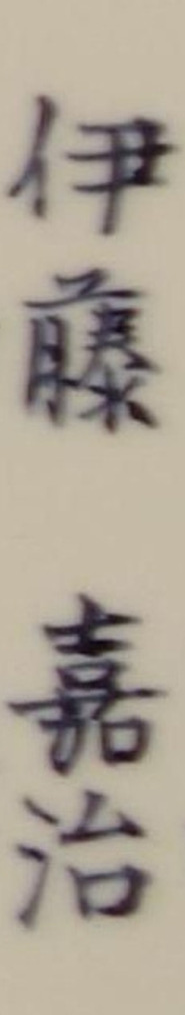伊藤嘉治
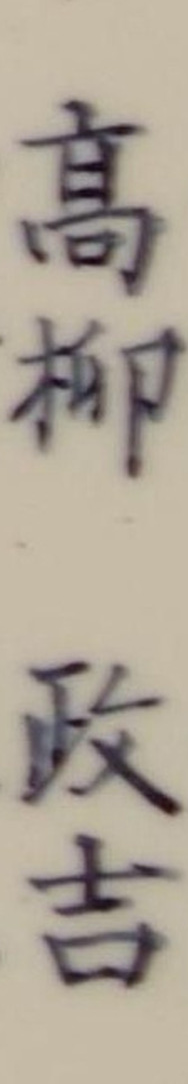高柳政吉
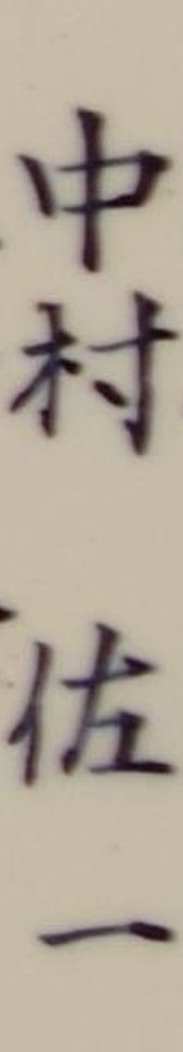中村佐一
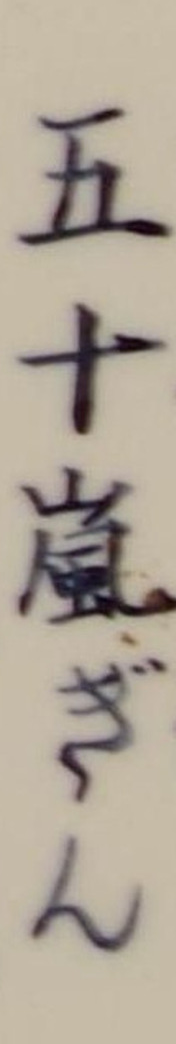五十嵐ぎん
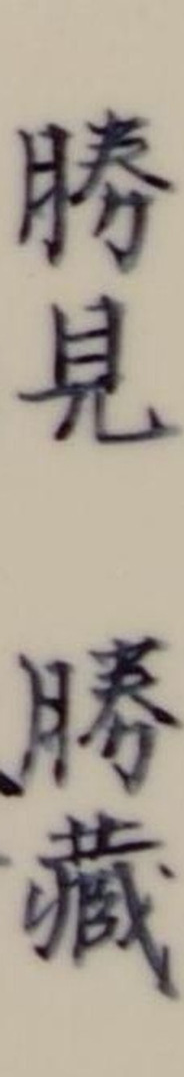勝見勝蔵
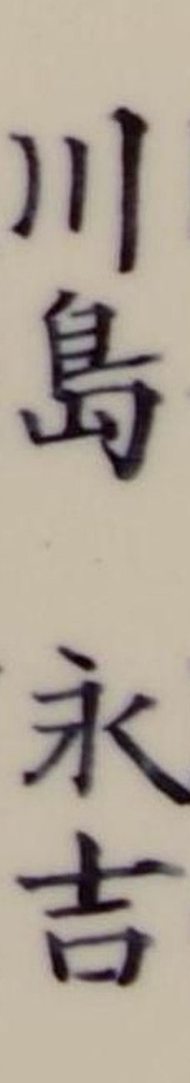川島永吉
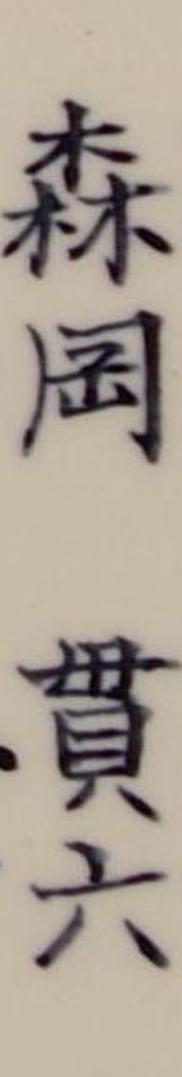森岡貫六
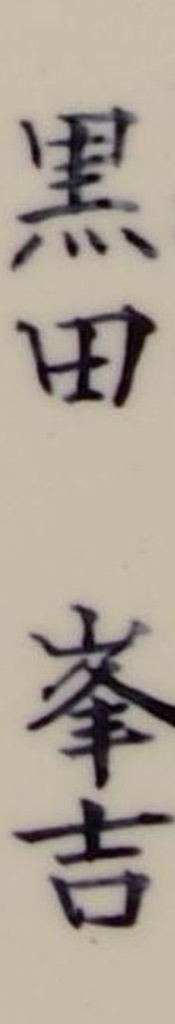黒田峯吉
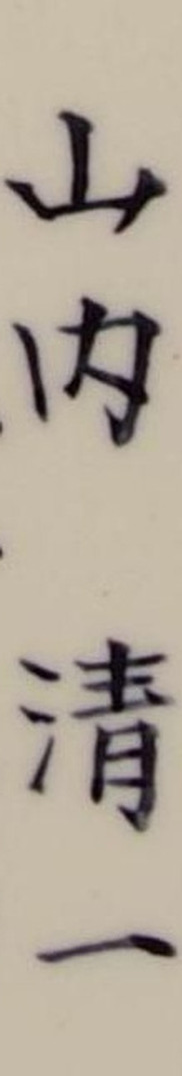山内清一
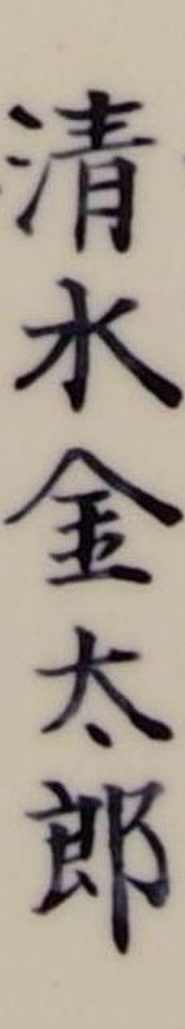清水金太郎
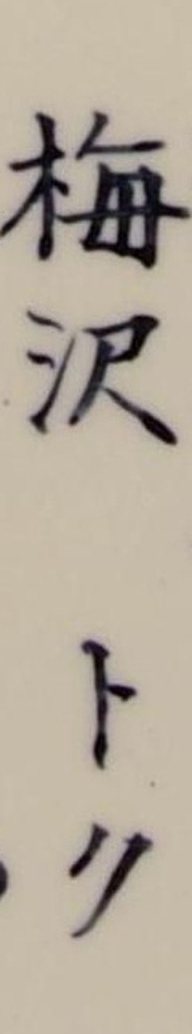梅沢トク
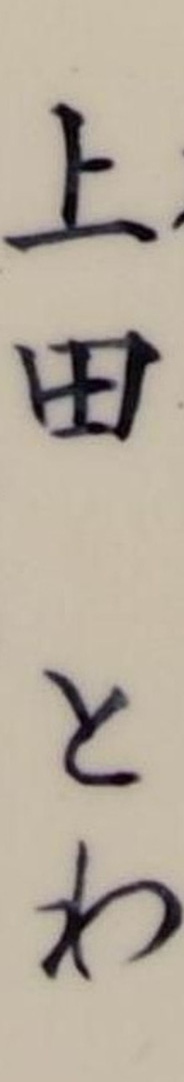上田とわ
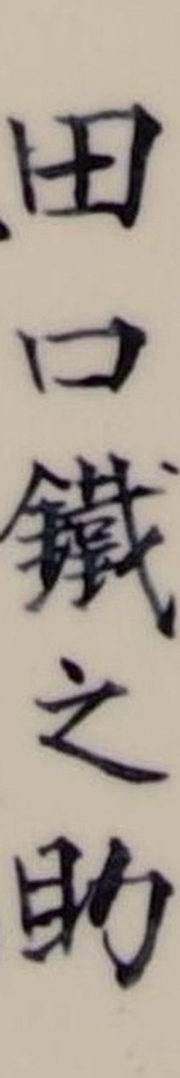田口鐵之助
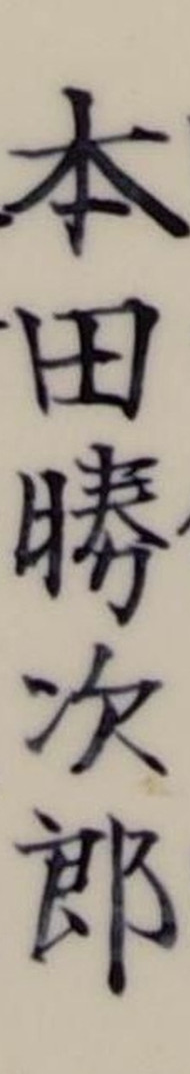本田勝次郎
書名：E~L
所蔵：高野山金剛峯寺
